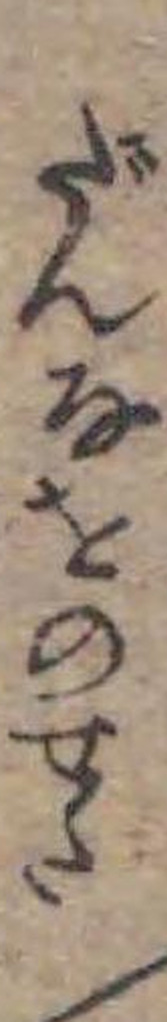だんなをのせた
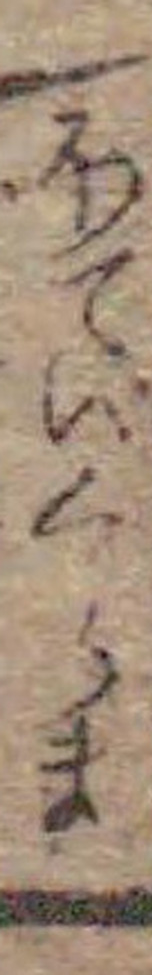ほていくらま
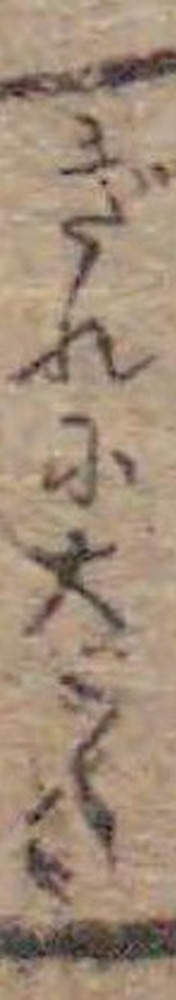ぎれに大こくと
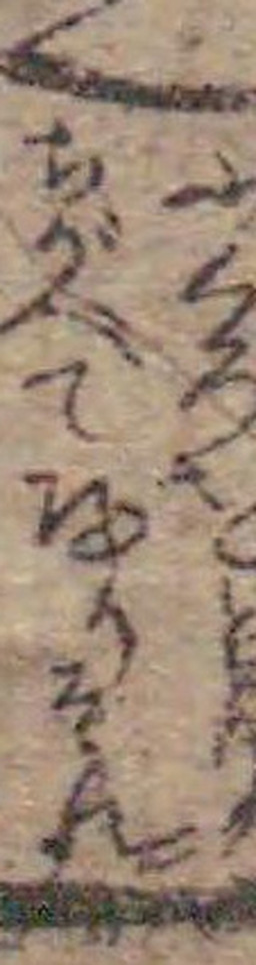ちがへて帰りそれ
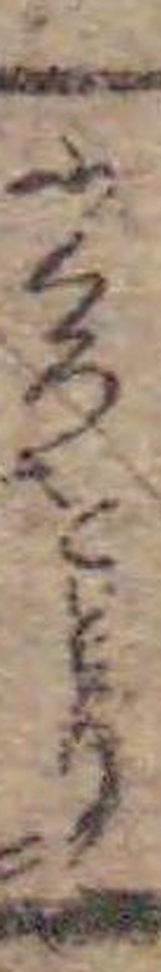ふくろをとり
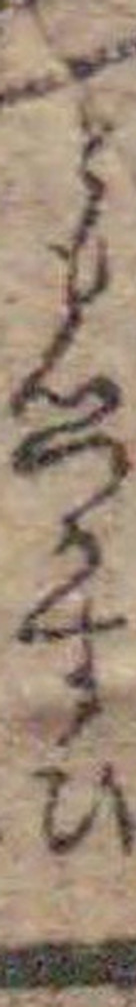とも心つかすひ
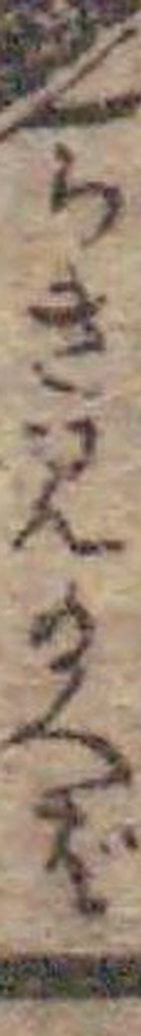らき見たまへば
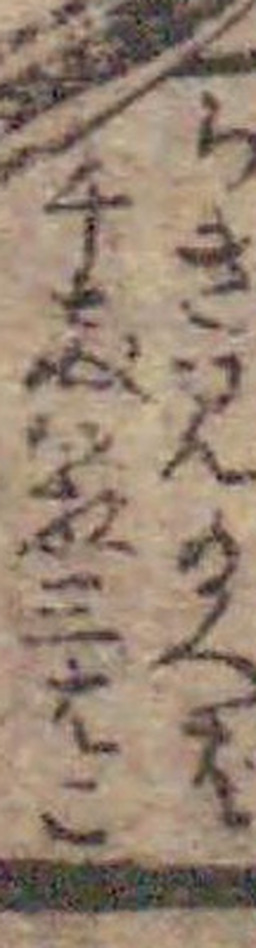千両袋三はこ
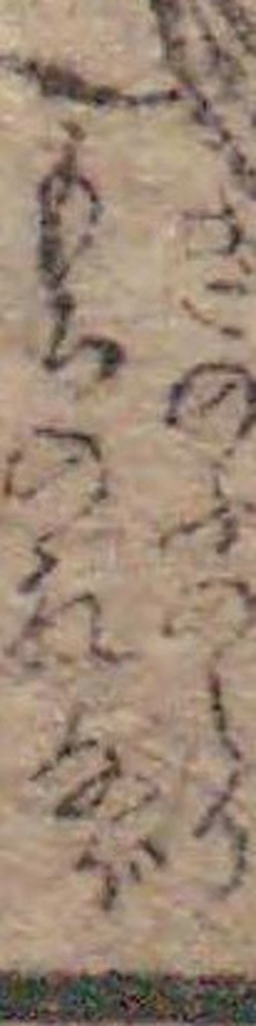もちのゝれなが
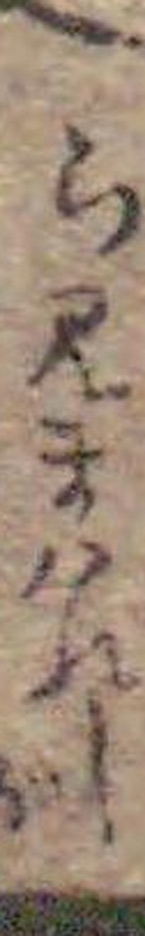ら見まはれしが
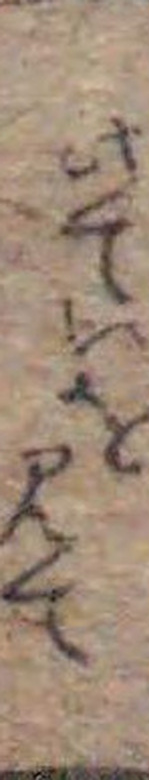此ていを見て
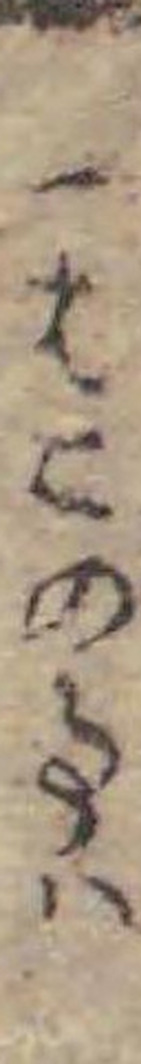一はこの事は
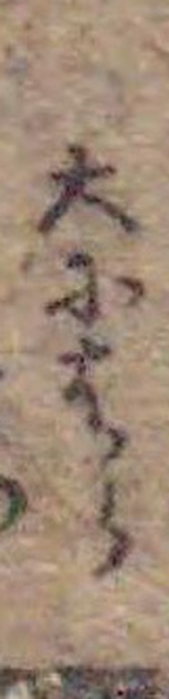大にはら
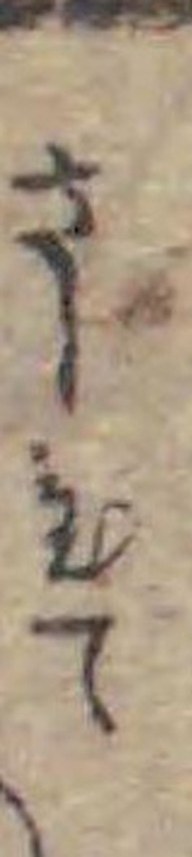さし置て
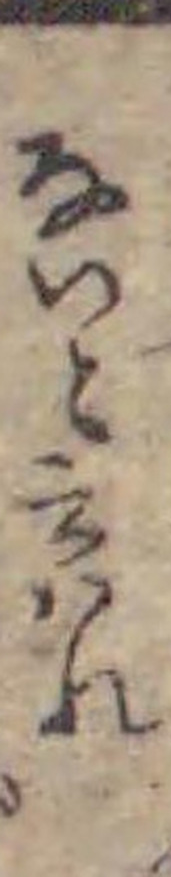ないと云はれ
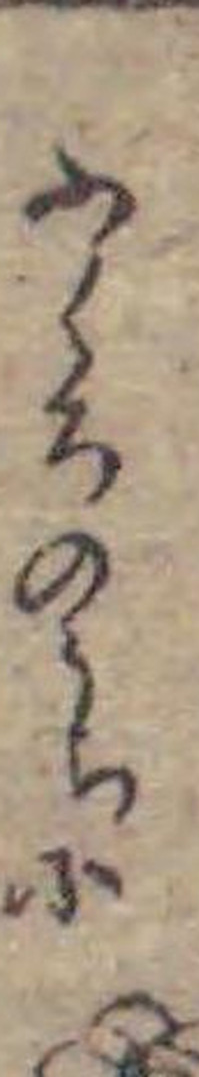ふくろのうちに
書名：蛭子大黒壮年過 : 2巻
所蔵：国立国会図書館 National Diet Library, JAPAN
